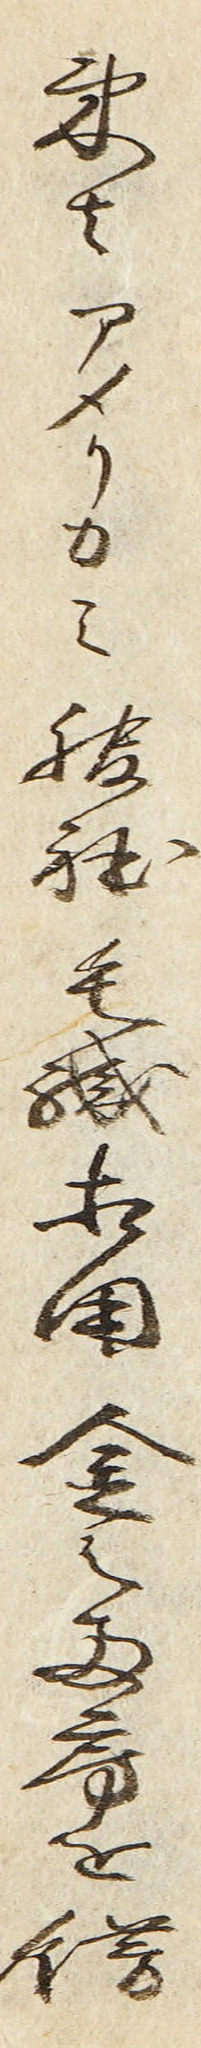束はアメリカ之服躰毛織相用金之両房を餝
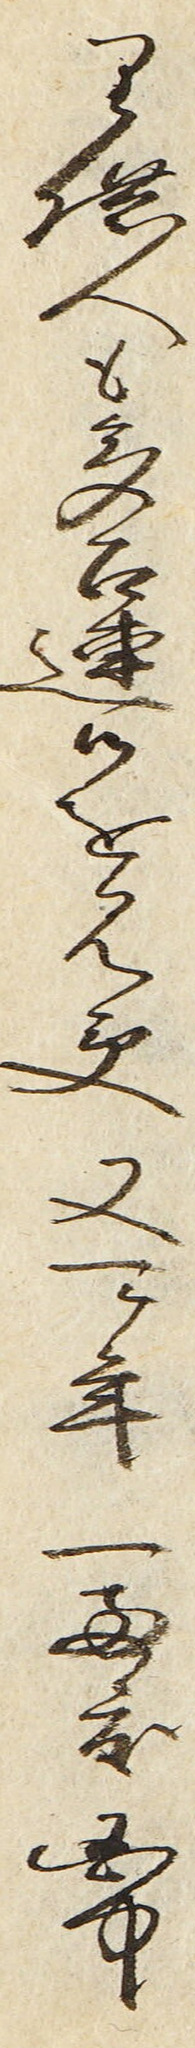り供人も多召連候を見受又一ヶ年一両度国中

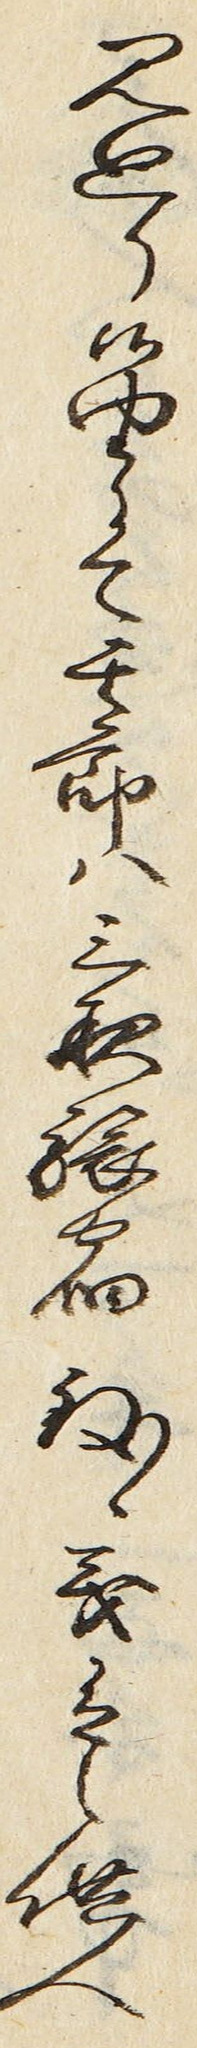見廻り候由にて其節は三夜旅宿致候義有之供人
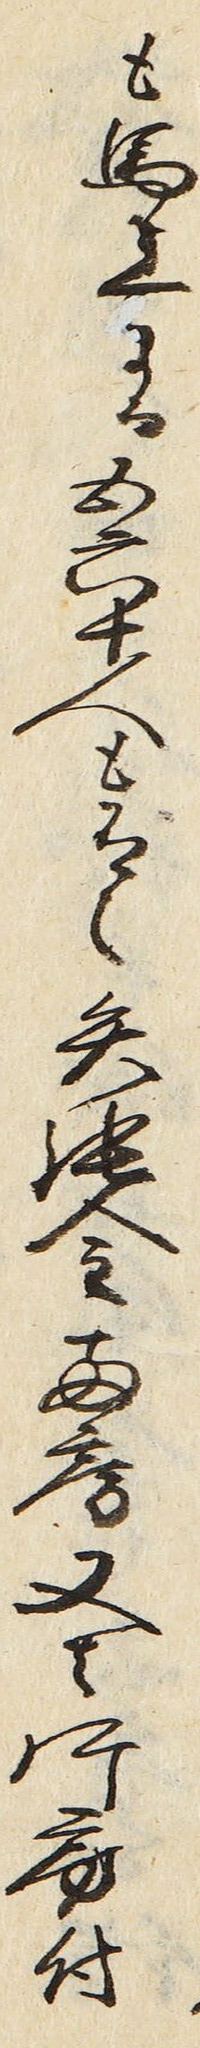も馬上に而五六十人も有之矢張金両房又は片房付
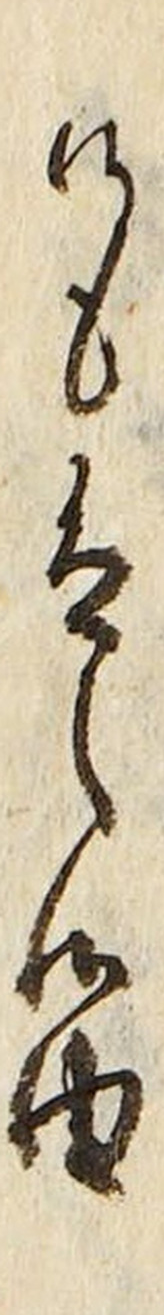候も有之候由
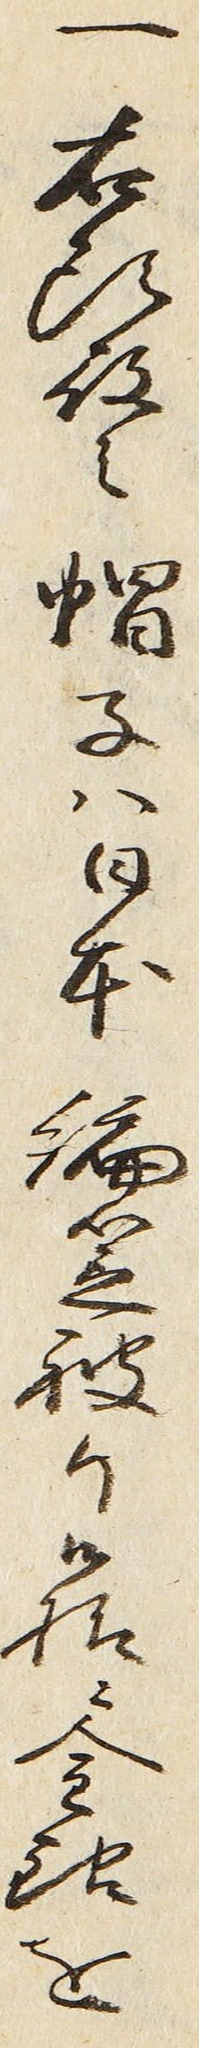一右頭役之帽子は日本編笠被り候様に金銀を
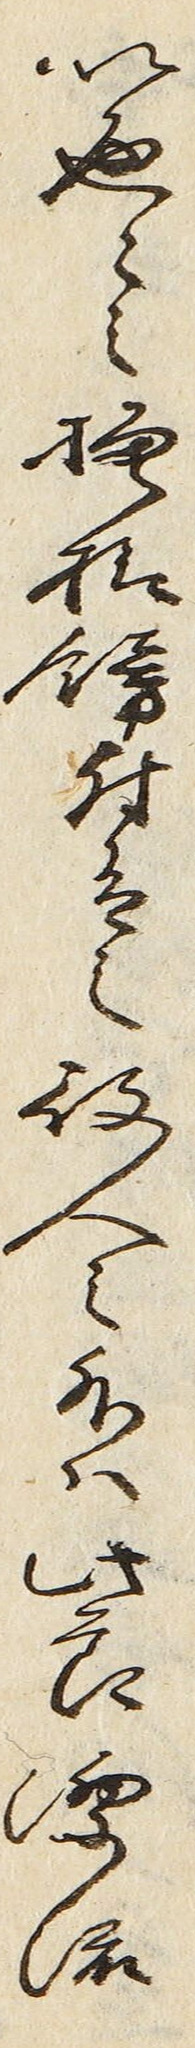以色々之模様餝付有之役人之外は此節漂流
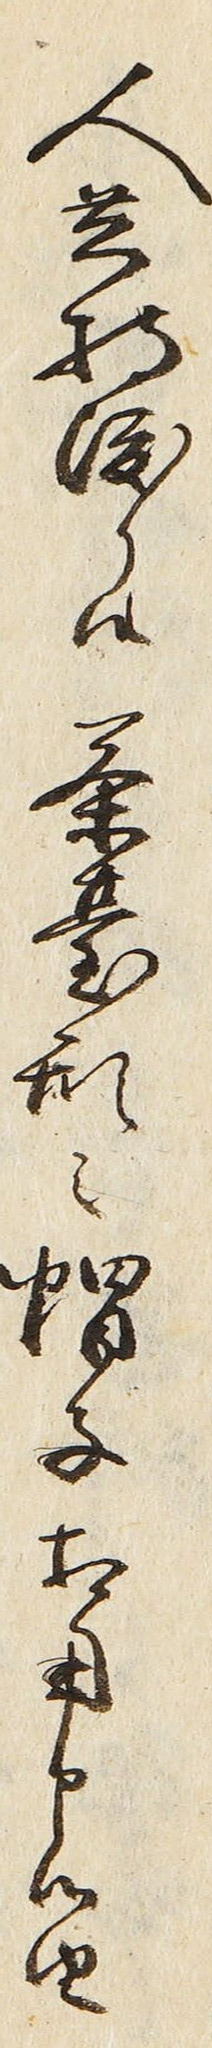人共持渡り候茶台形之帽子相用申候由
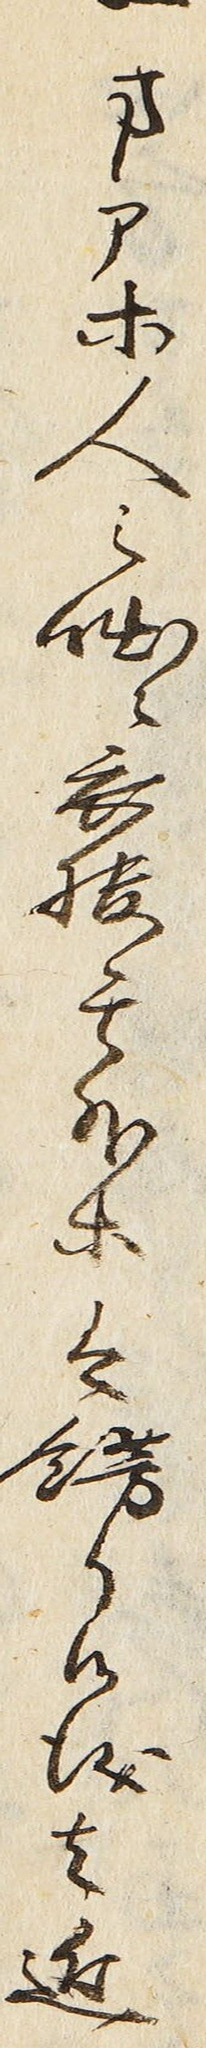一オアホ人之咄に衣服其外等は餝り候儀は近
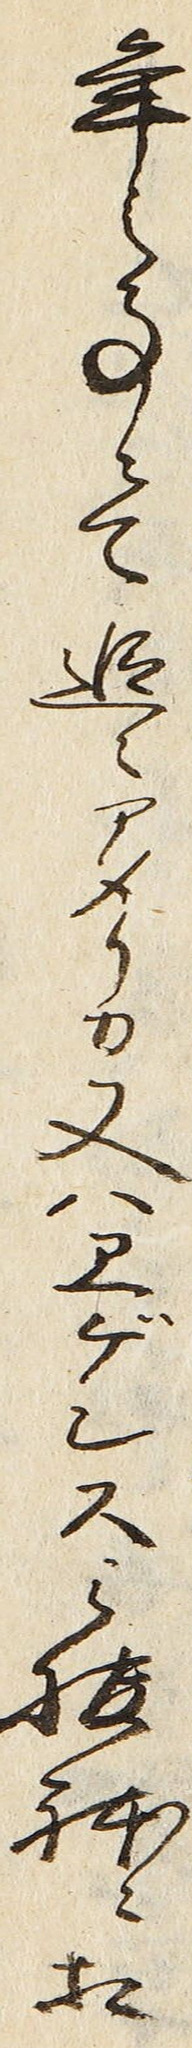年之事にて追々アメリカ又はエゲレス之服躰に相
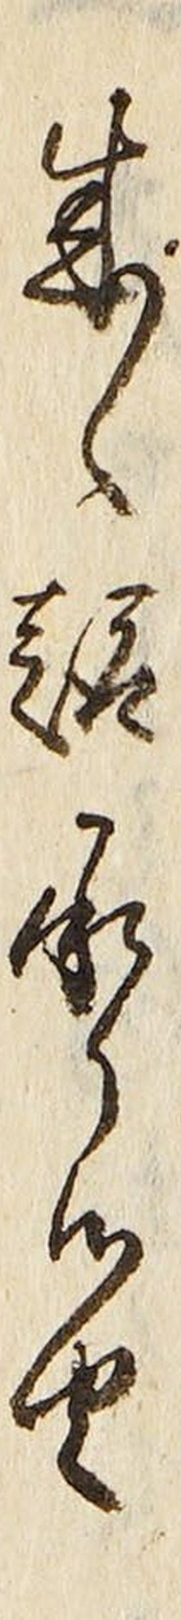成候趣承り候由
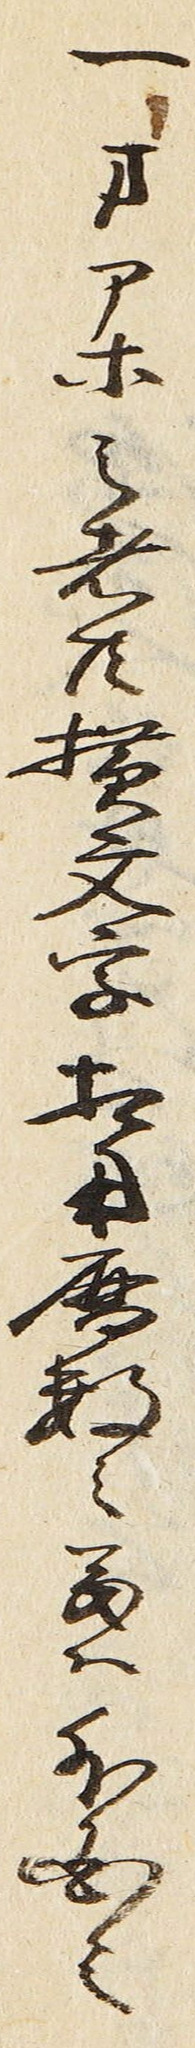一オアホ之者共横文字相用暦数之義は外国之
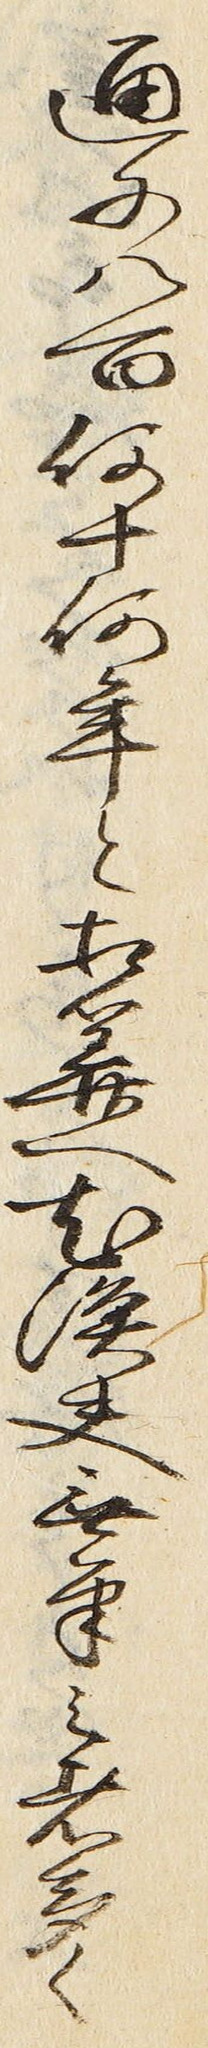通千八百何十何年と相算へ尤漁夫無筆之者多く
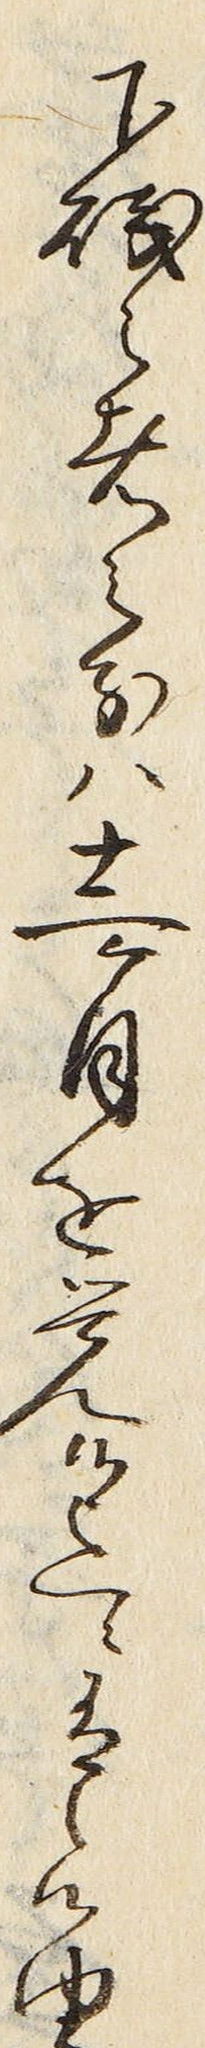下賤之者之分は十二ヶ月を覚候迄に有之候由
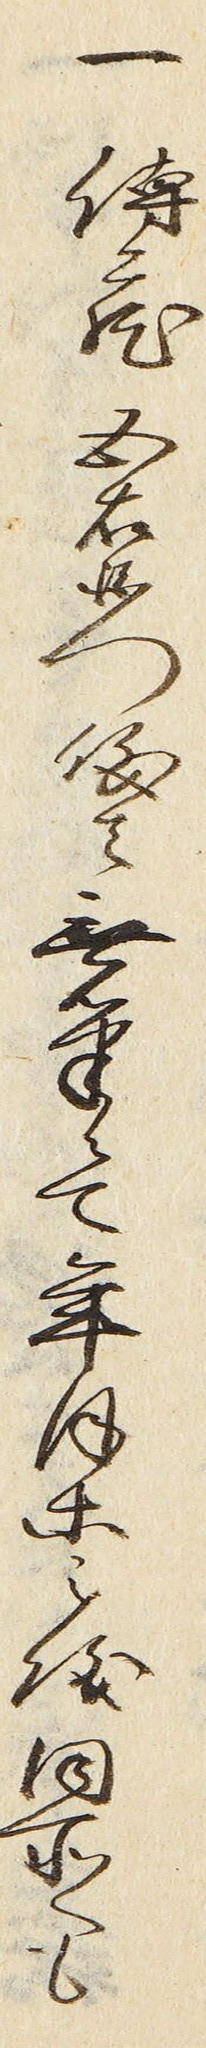一伝蔵五右衛門儀は無筆にて年月等之儀同所へも
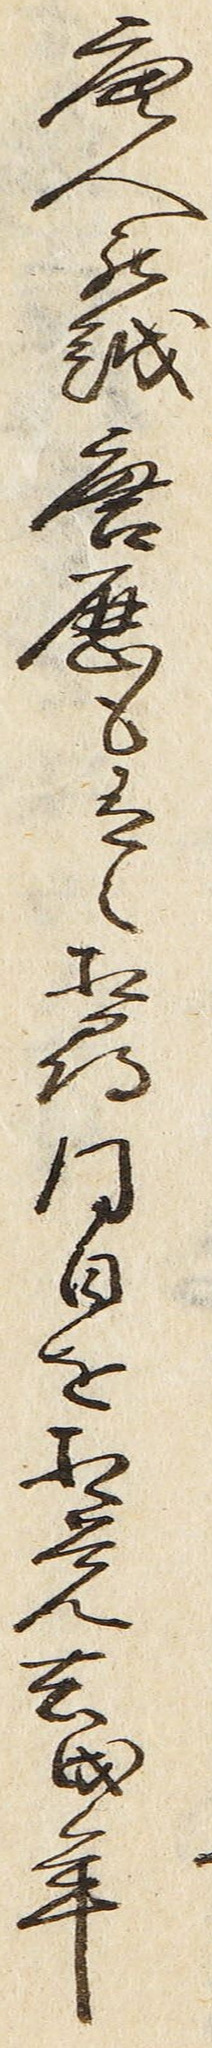唐人罷越唐暦も有之相尋月日を相覚去戌年
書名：土佐中浜万次郎漂流記
